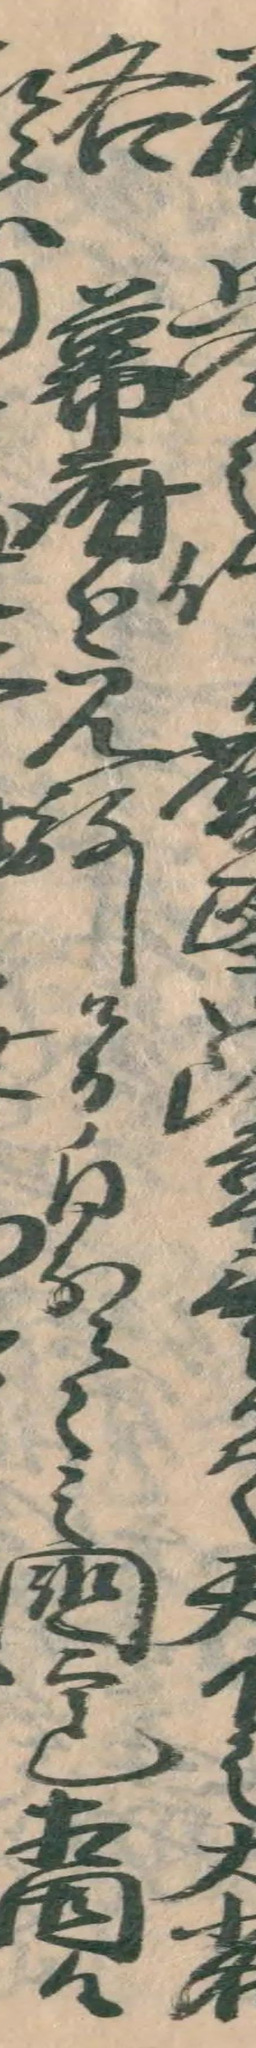各幕府を見放し候而自分々々之国而已相固候
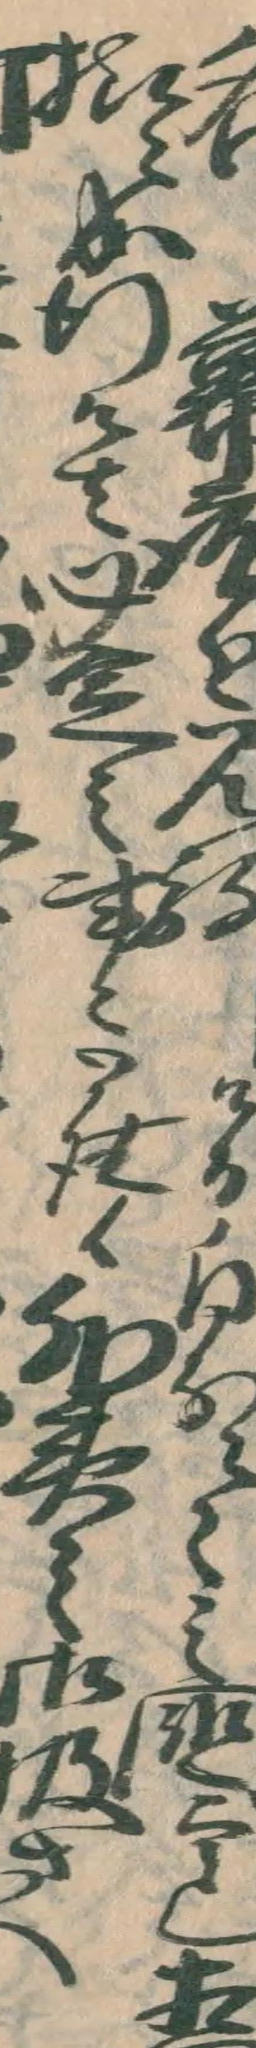様ニ成行候者必定之事ニ御座候外夷之御扱さへ
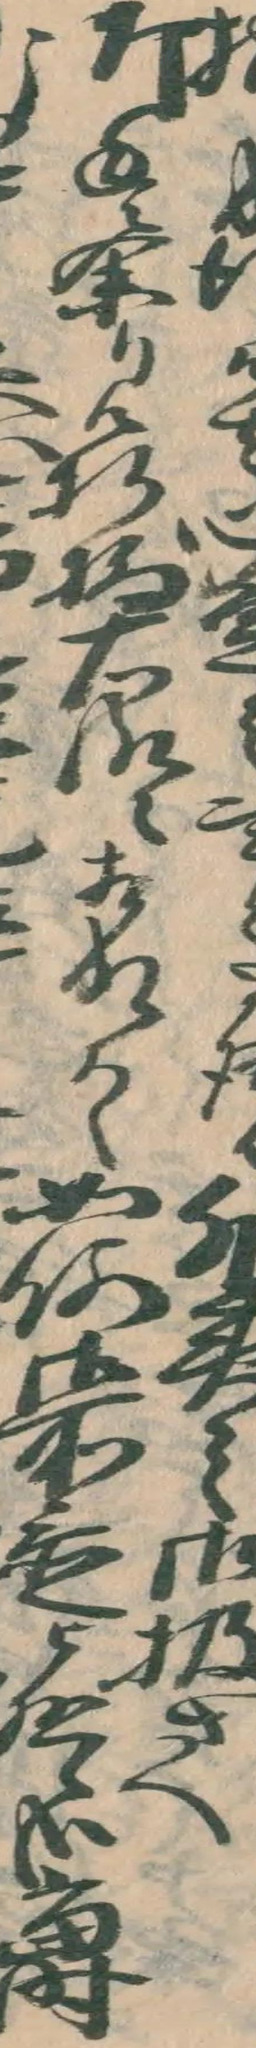御手ニ余り候折柄右様ニ相成候ハヽ如何御処置被遊候哉當時
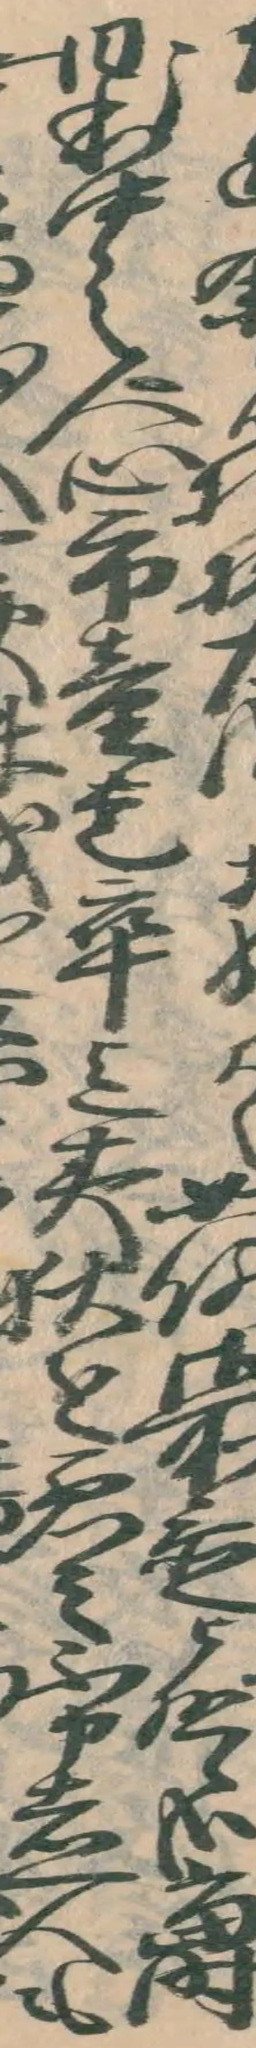日本中之人心市童老卒迄夷狄を悪ミ不申者一人も
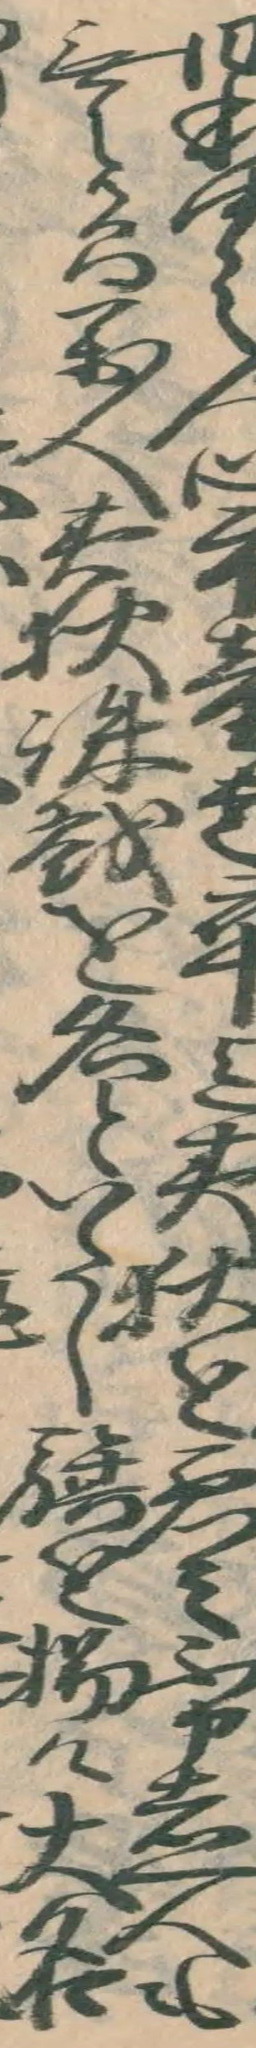無之候間萬人夷狄誅戮を名といたし旗を揚ル大名
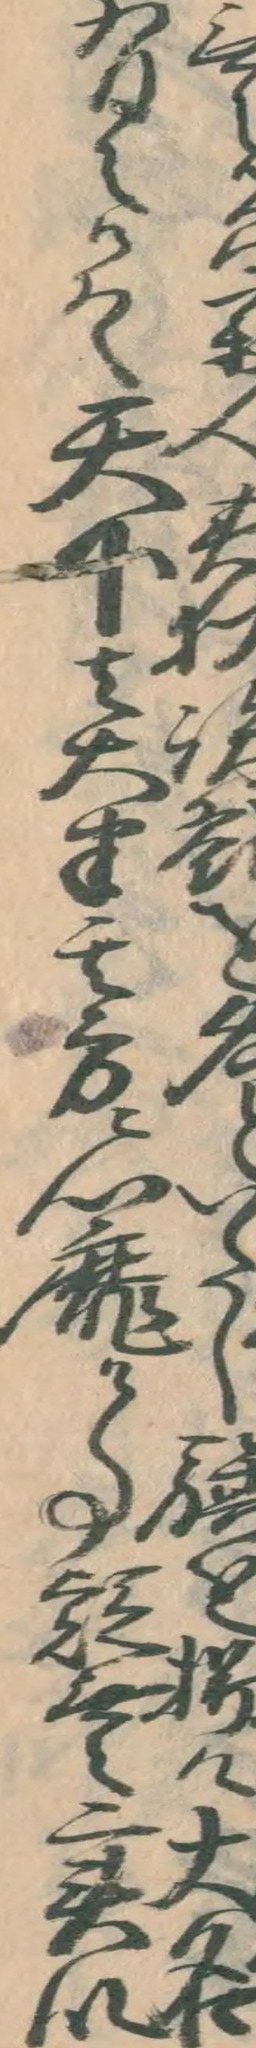有之候ハヽ天下者大半其方ニ心靡候事疑無之実以

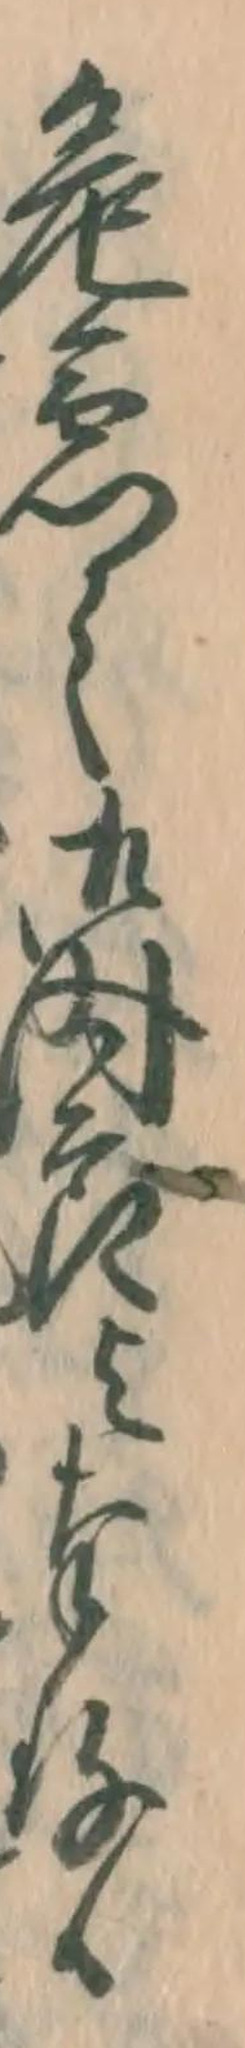危急之御時節と奉存候
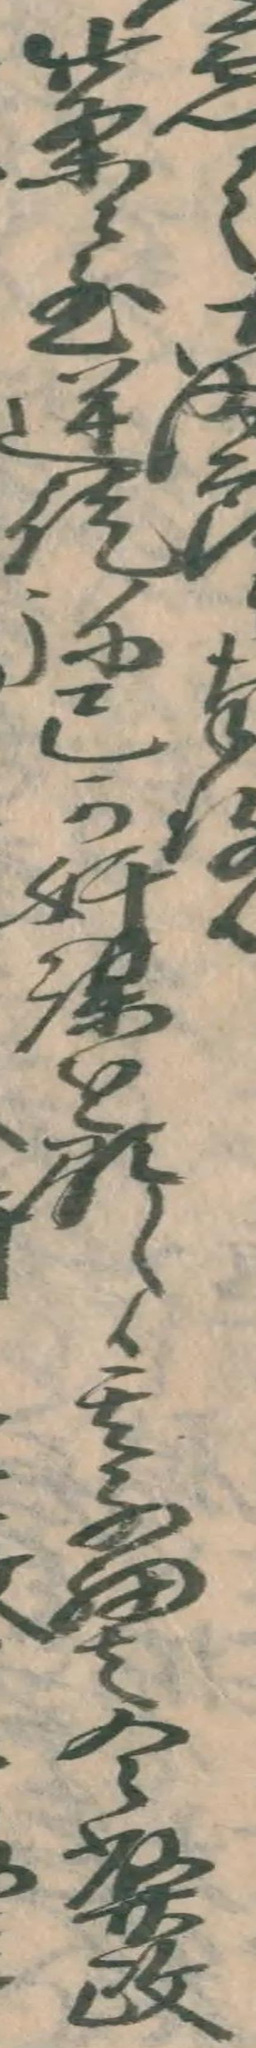此条ニ至逆徒弥己か奸謀を顕し候其子細者今弊政
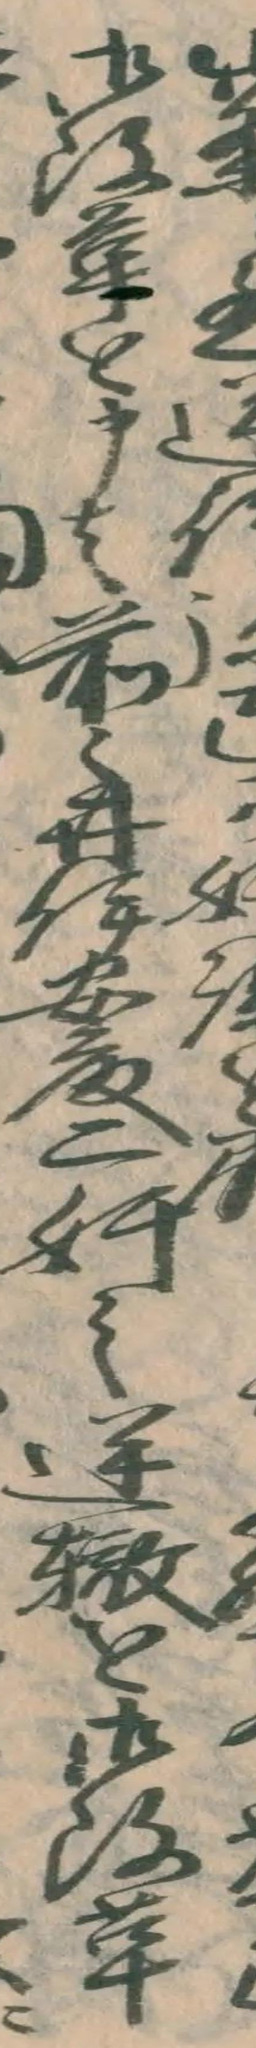御改革と申者前ニ井伊安藤二奸之逆轍を御改革
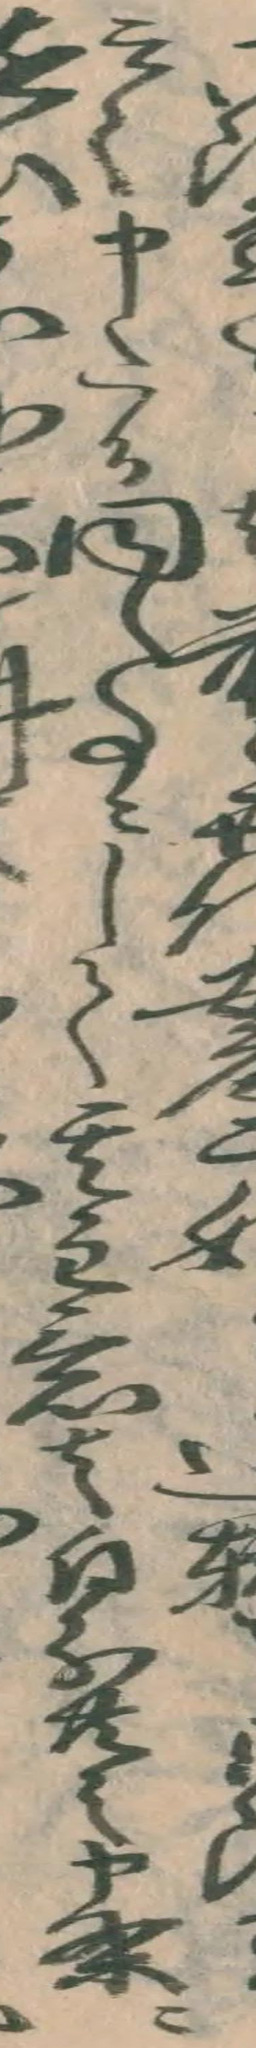云々申たる同し事ニして其主意者自分共之申条ニ
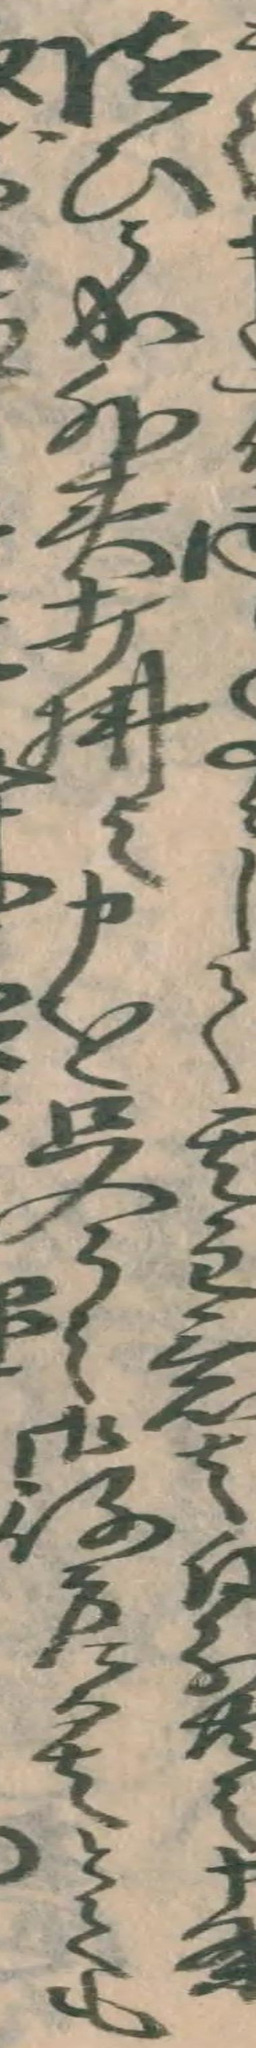随ひ被成外夷打拂と申を只今之御役方ニ而者とても
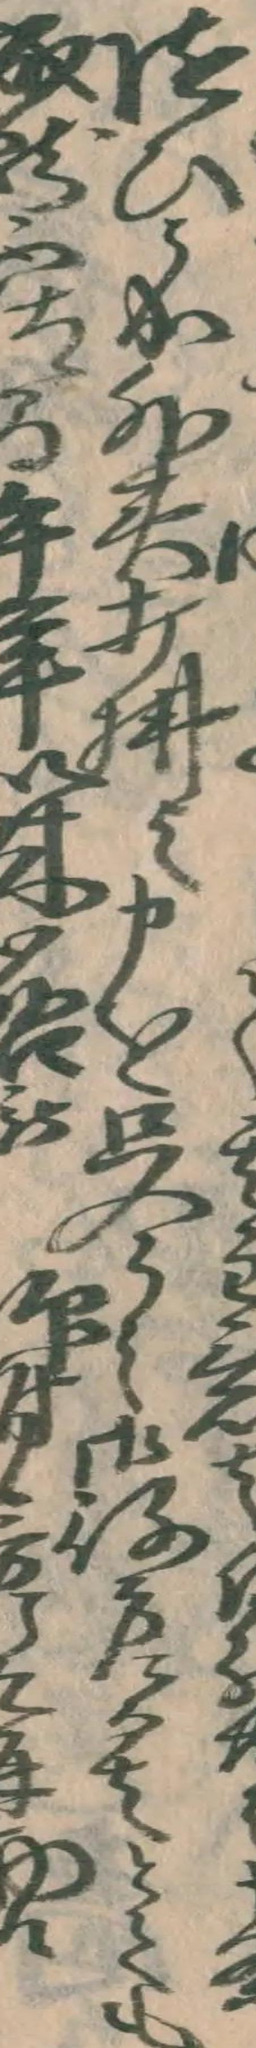随ひ被成外夷打拂と申を只今之御役方ニ而者とても
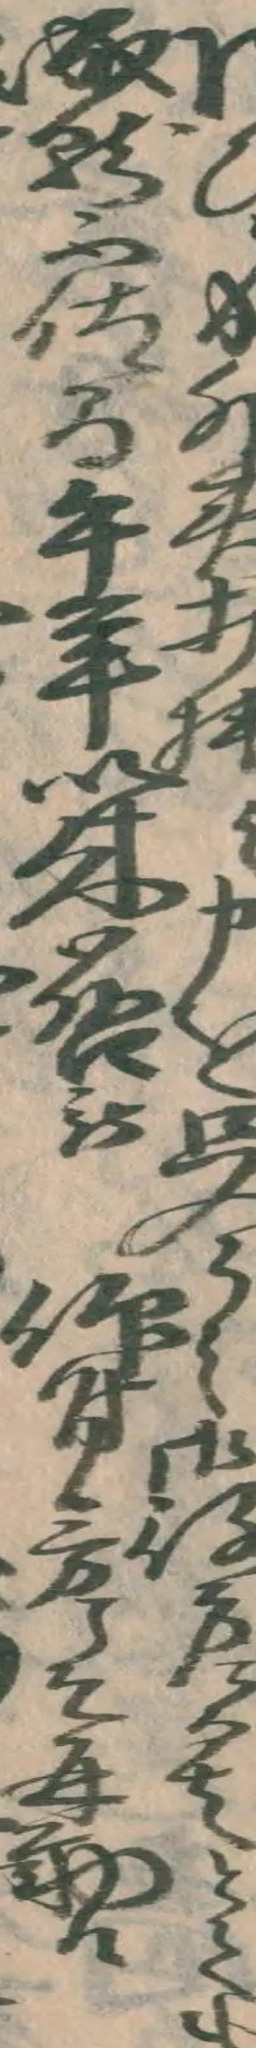成就不仕候間午年以来御咎被仰付候方被乞再勤被
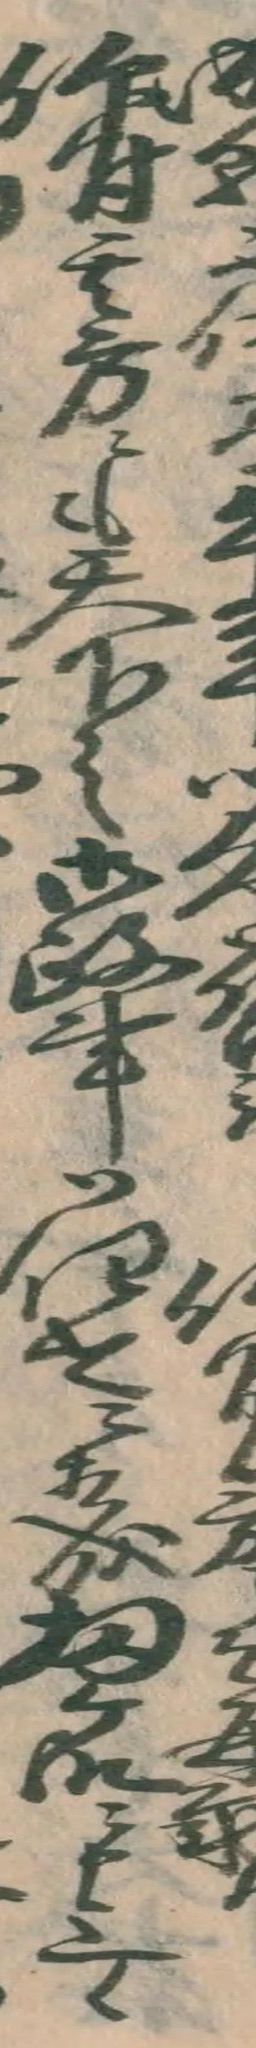仰付其方ニも天下之御政事御任せニ相成扠ケ様ニ申上候
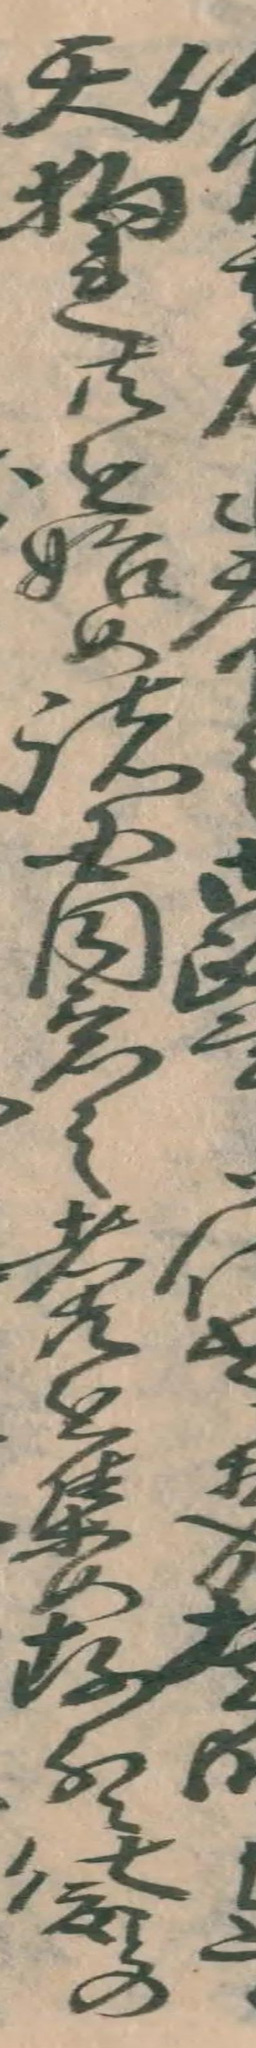天狗連共を始め諸国同意之者共を集め存分ニ仕度との
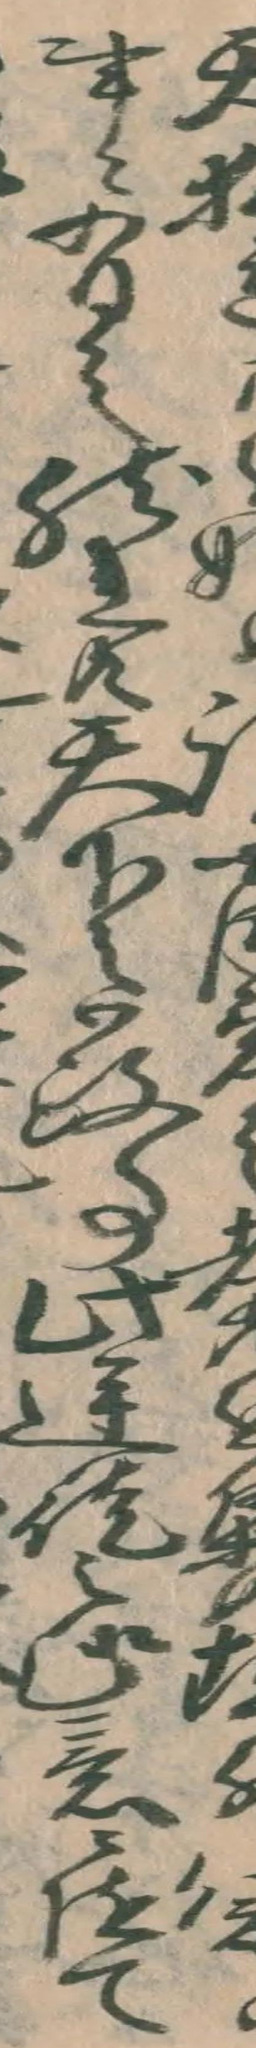事ニ有之然れ共天下之御政事此逆徒之趣意ニ随て
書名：麗斎叢書. 20
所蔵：国立国会図書館 National Diet Library, JAPAN
